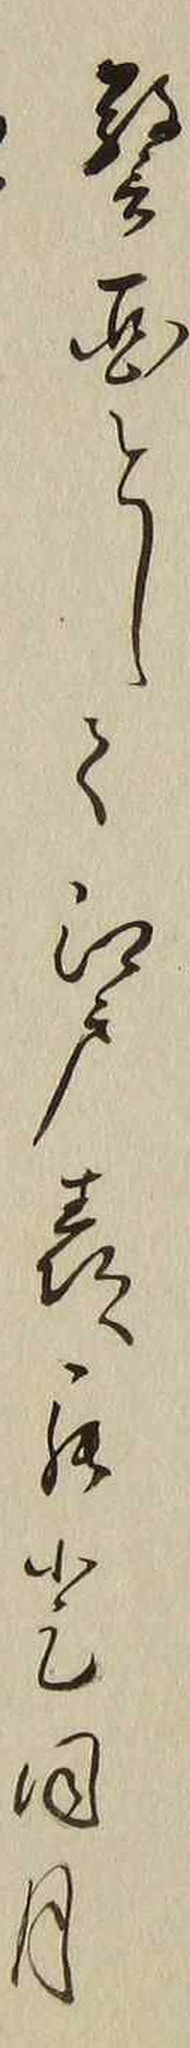警固として江戸表へ罷登同月
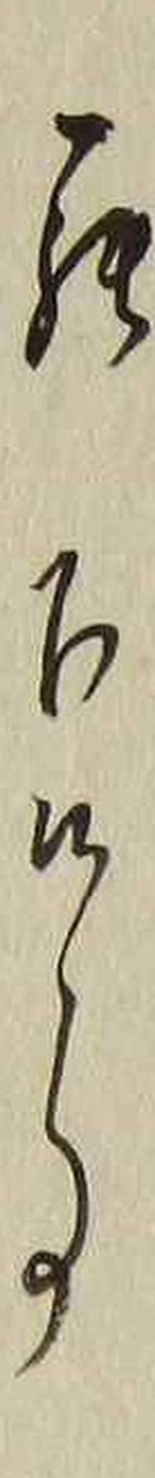罷下候事
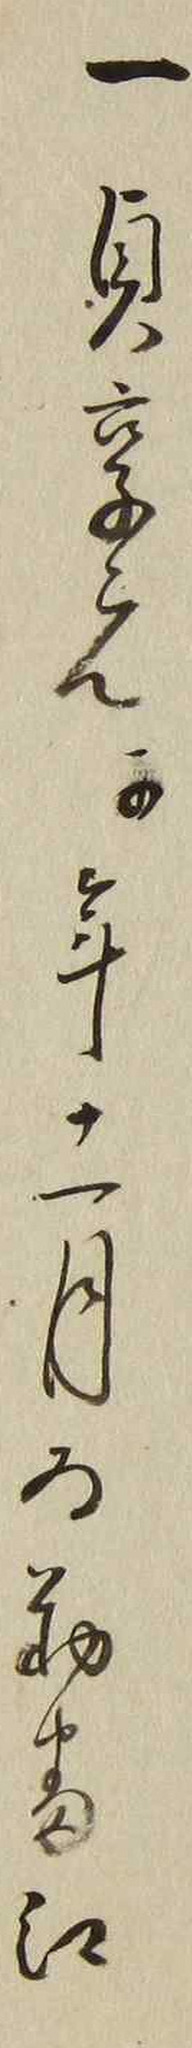一貞享元子年十一月為勤番江
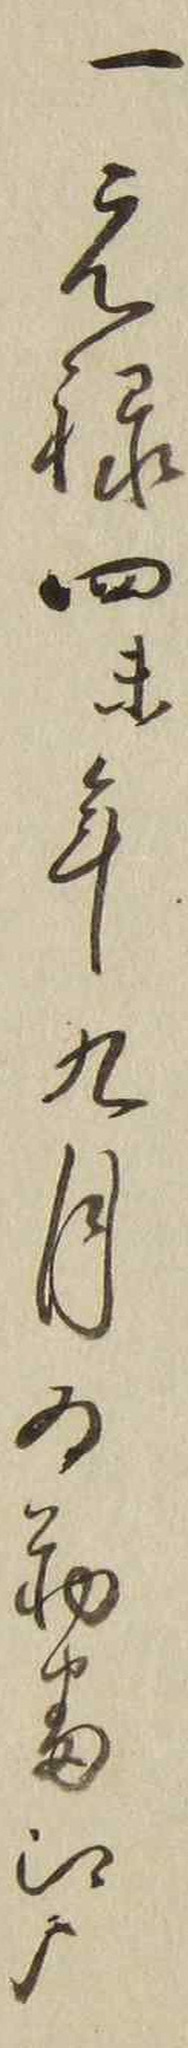一元禄四未年九月為勤番江戸

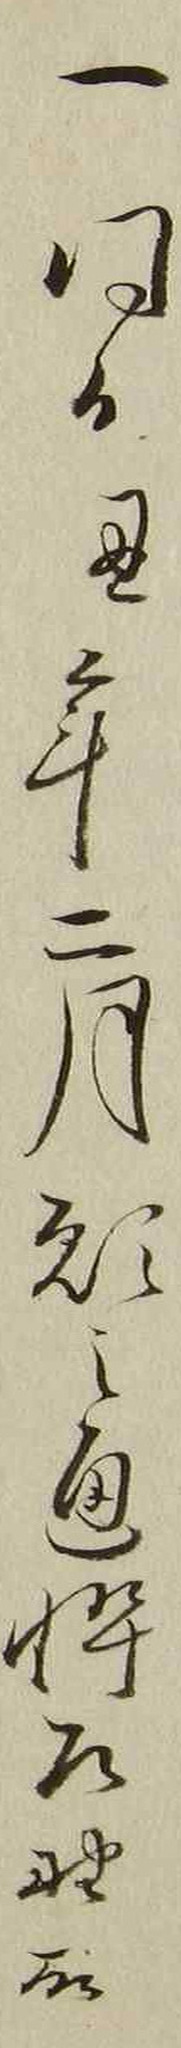一同十丑年二月願之通忰佐野右
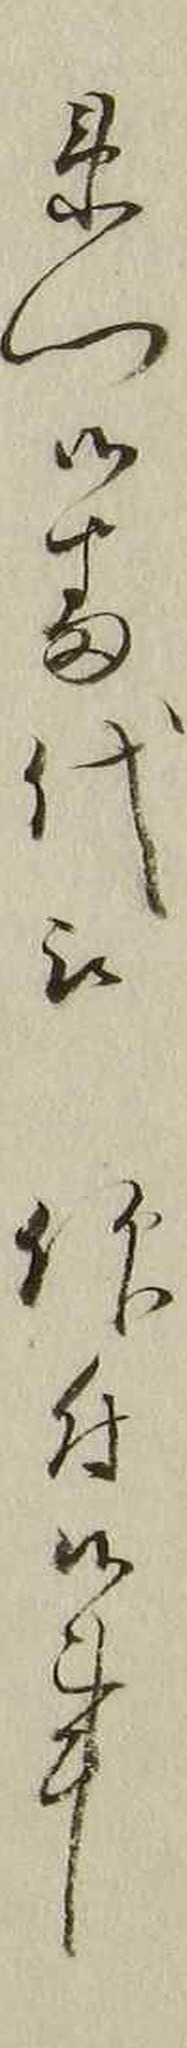衛門御番代被仰付候事
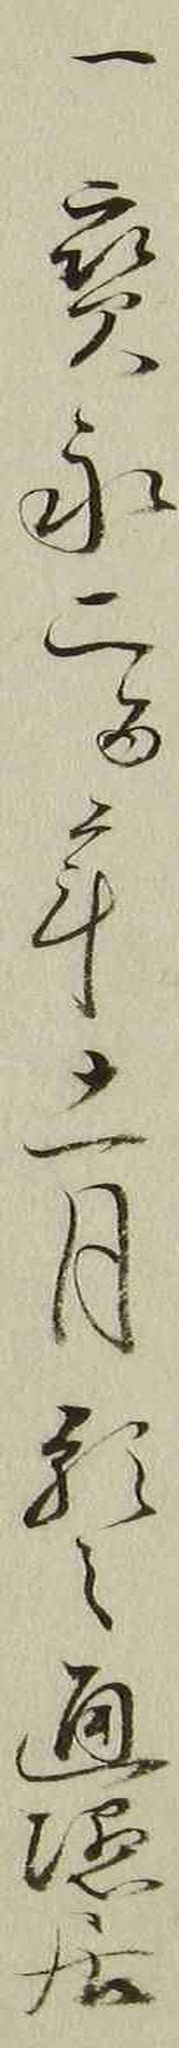一寛永二酉年十一月願之通隠居
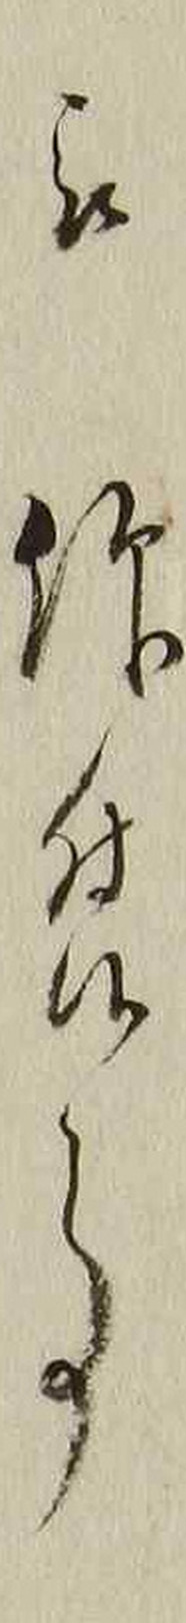被仰付候事
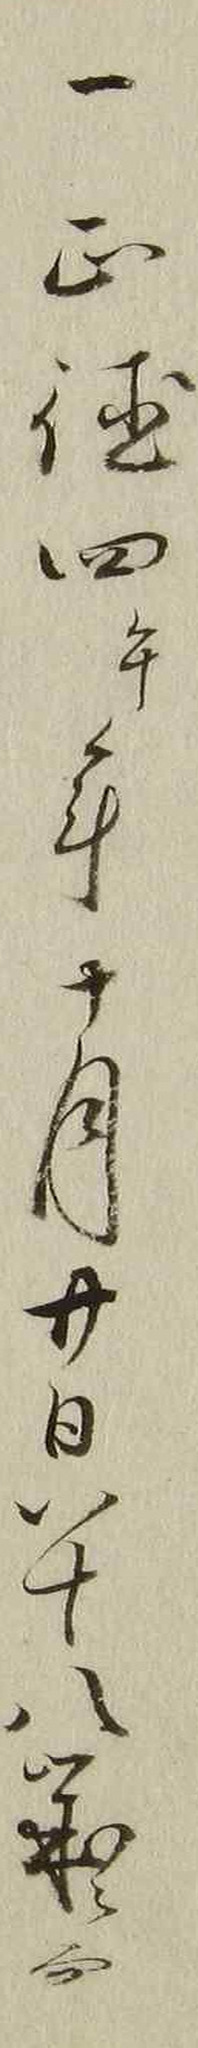一正徳四午年十月廿日八十八歳ニ而
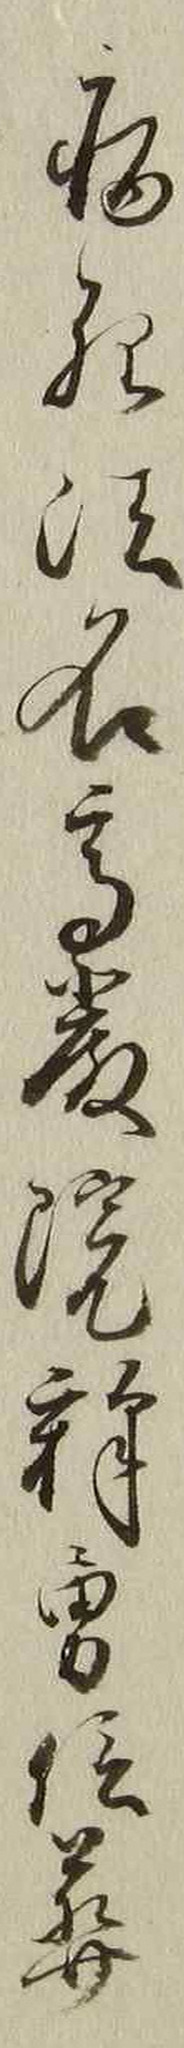病死法名高厳院釈勇信葬
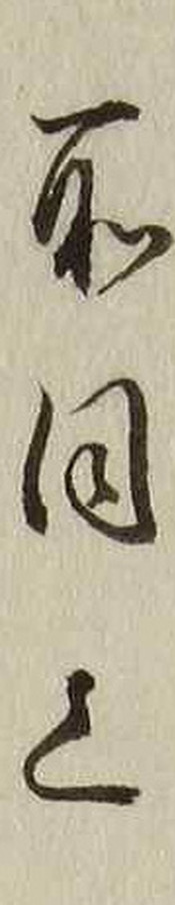所同上
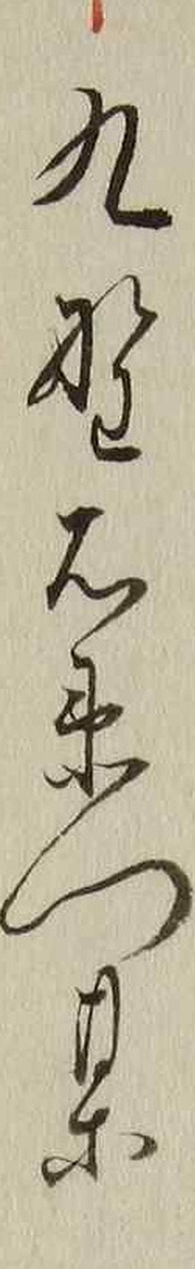九野右衛門某
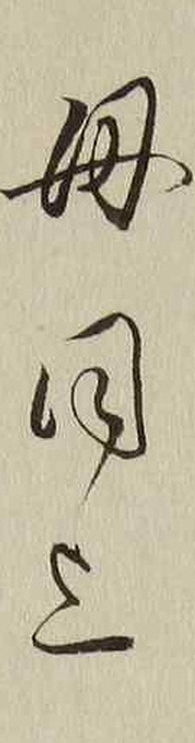母同上
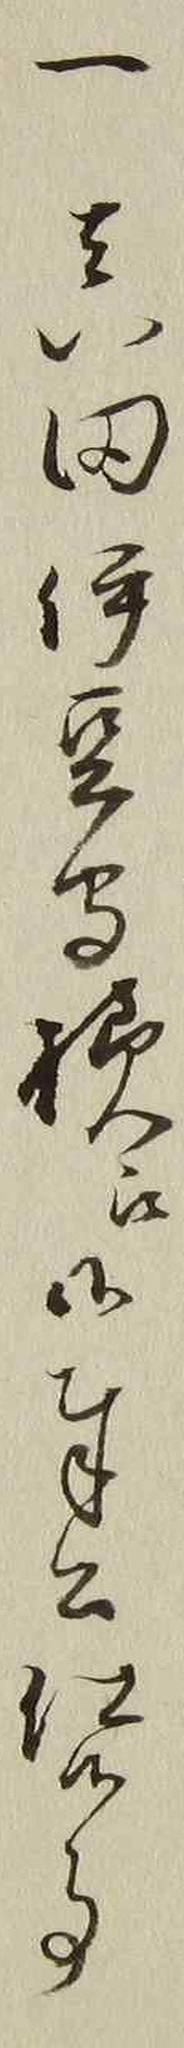一真田伊豆守様江御奉公仕候事
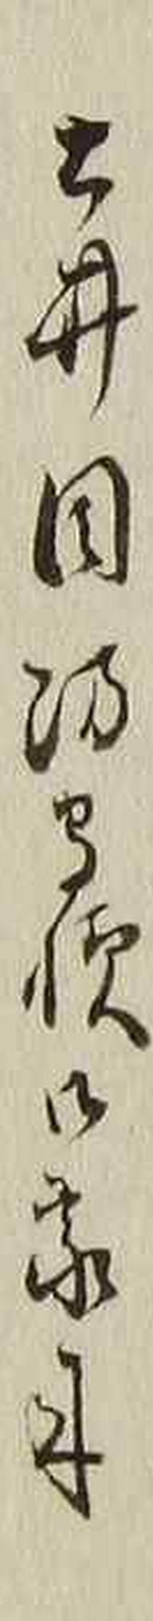土井周防守様御家来
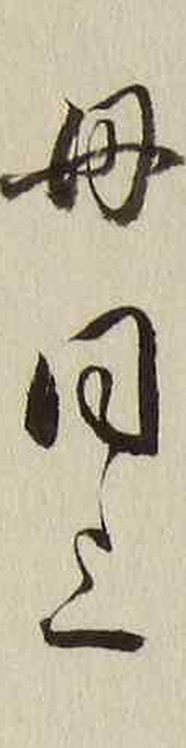母同上
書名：諸士系譜　巻之129　た之部5
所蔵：会津若松市立会津図書館
